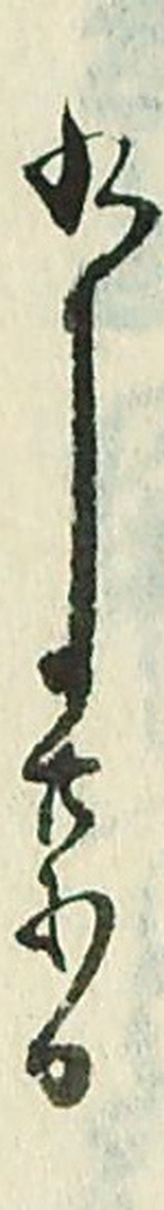九月廿五日
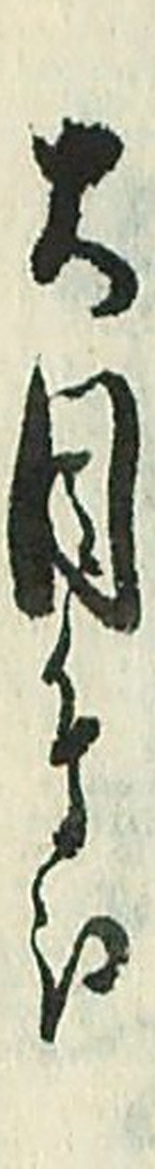大目付江
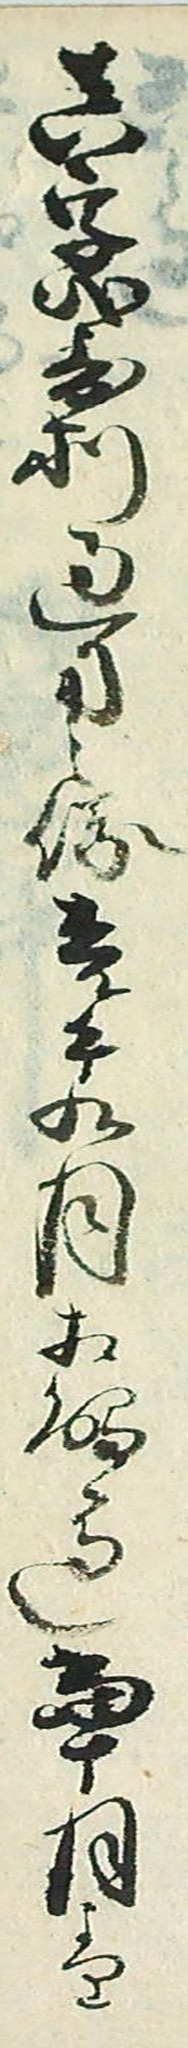真字弐歩判通用之儀去る午九月相触候通当十月より
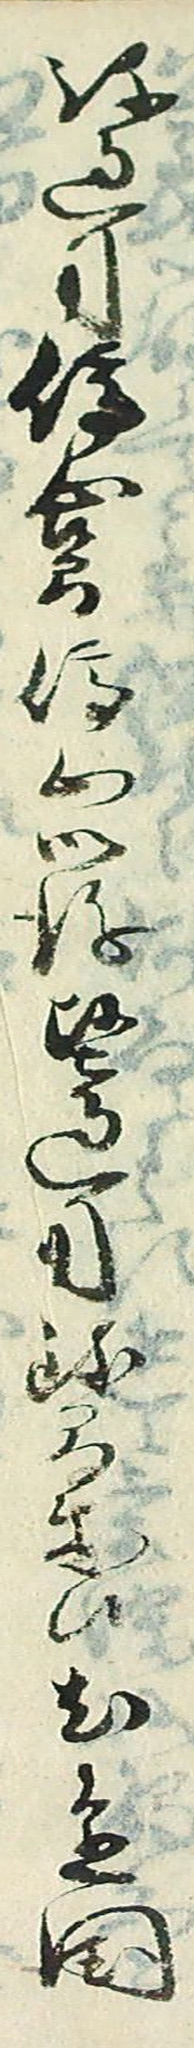弥通用停止候間停止以後堅通用致間敷候尤遠国
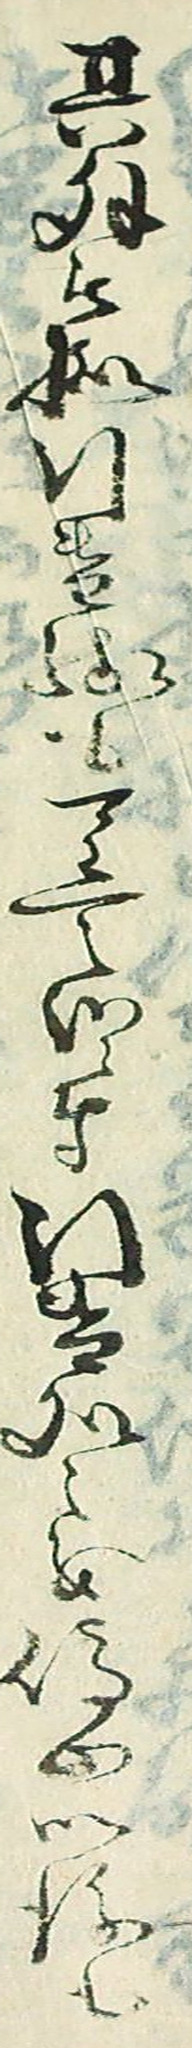其外無拠引替残も可有之哉に付引替処之義停止以後も
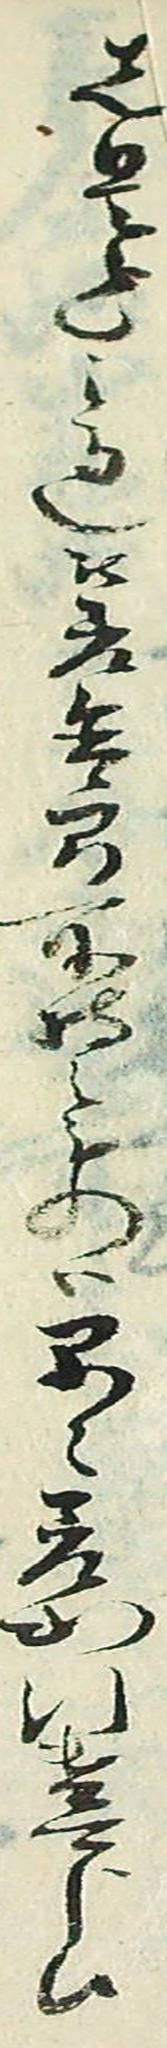先是迄之通被差置候間所持之ものは早々差出引替可申候
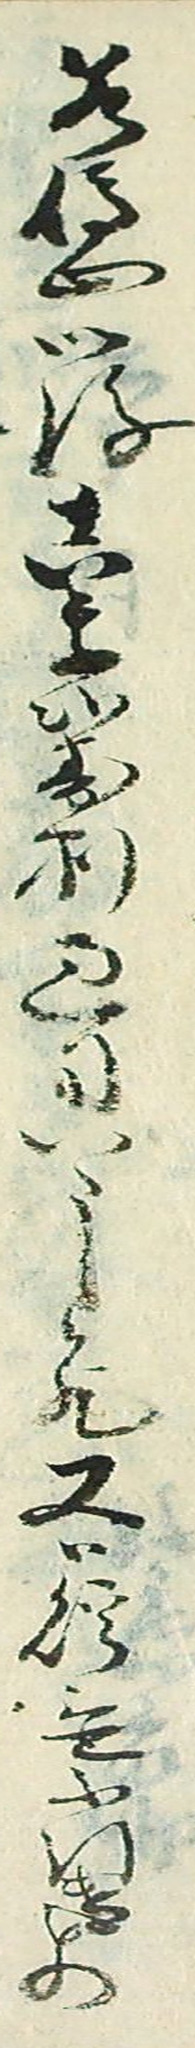若停止以後真字弐歩判通用いたし候歟又は貯置不引替もの
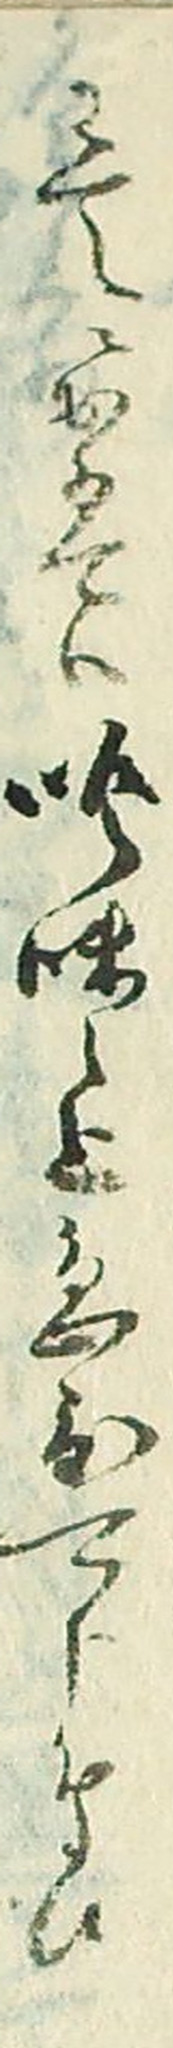有之におゐては吟味之上急度可申付候
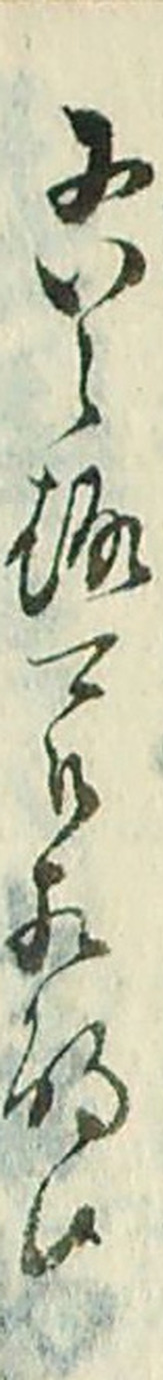右之趣可被相触候
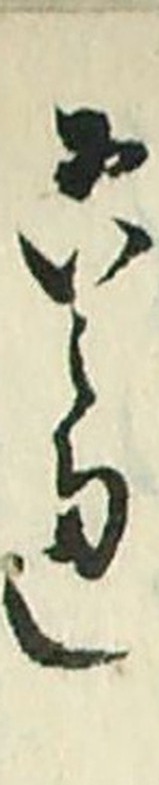右之通
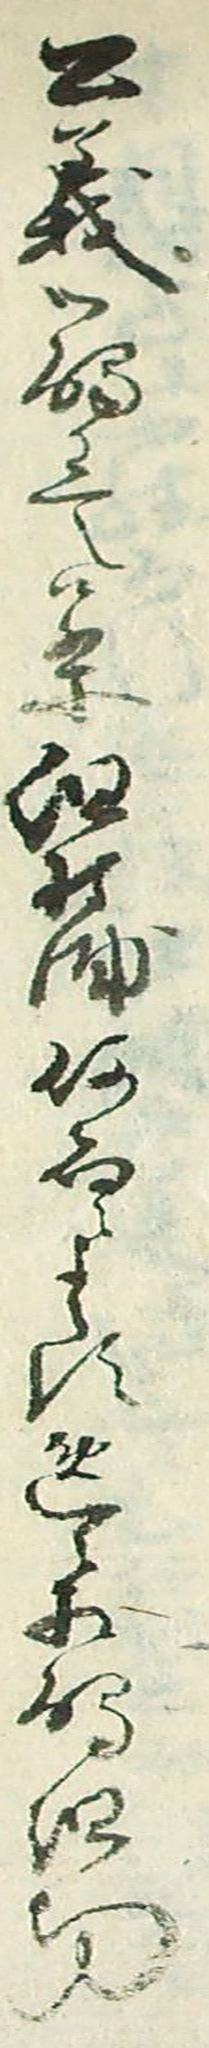公義御触有之候条組村浦何者によらす逸々相触
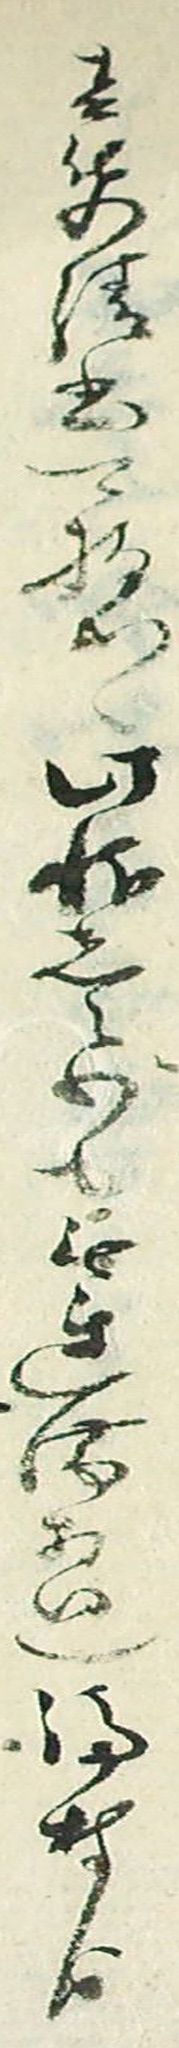壱紙請書可指出候此状先々少も無遅滞相廻済村ゟ
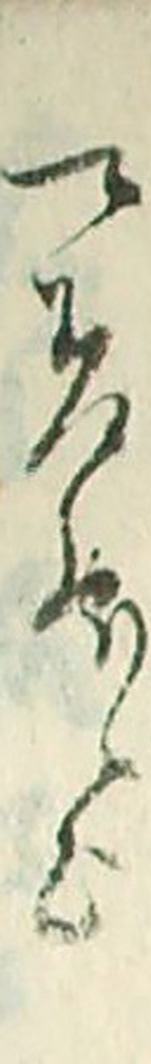可差戻候以上
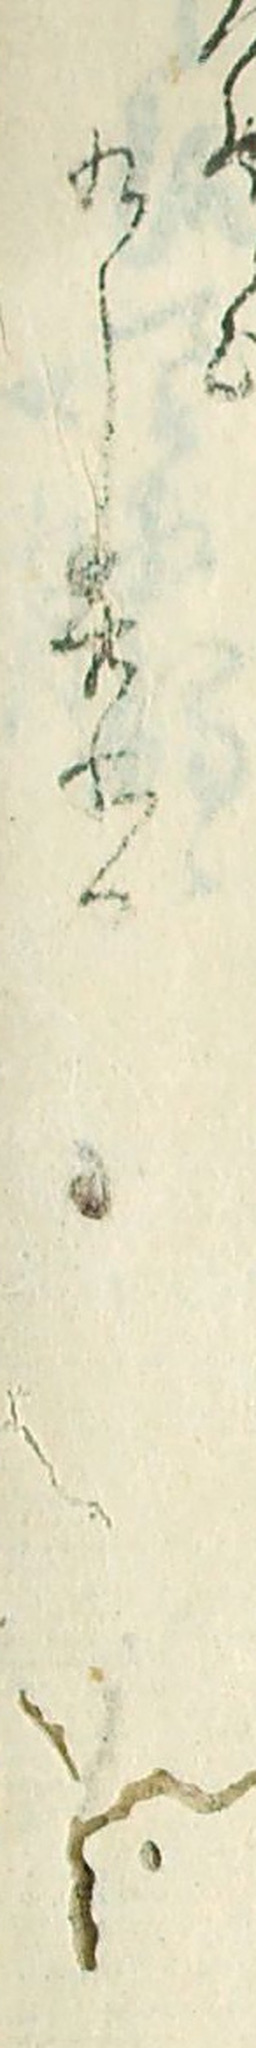九月廿五日
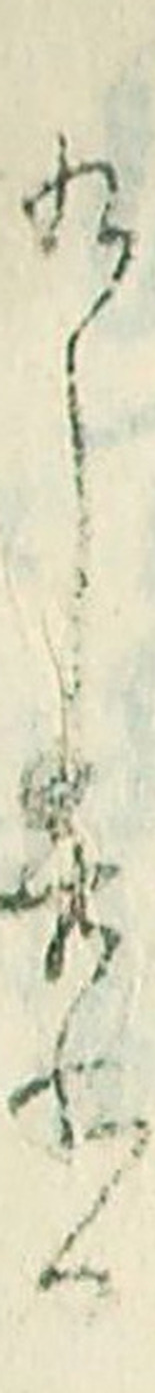九月廿七日

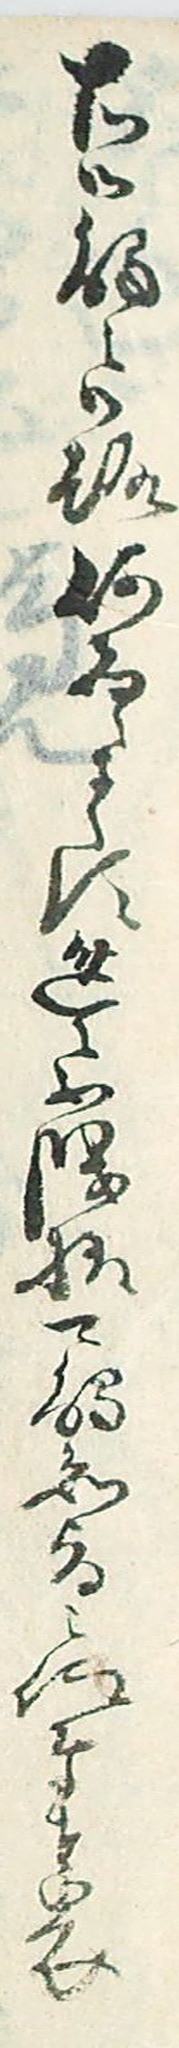右御触之御趣何者によらす不洩様可触知旨被仰付奉畏
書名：諸御用御□受書控
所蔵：鳴門教育大学 Naruto University of Education
